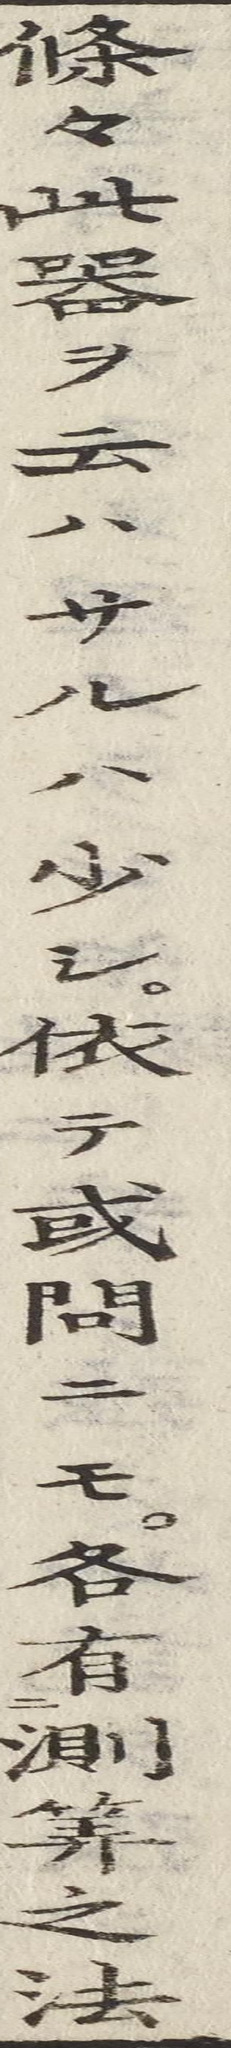條々此器ヲ云ハサルハ少シ。依テ或問ニモ。各有ニ測筭之法
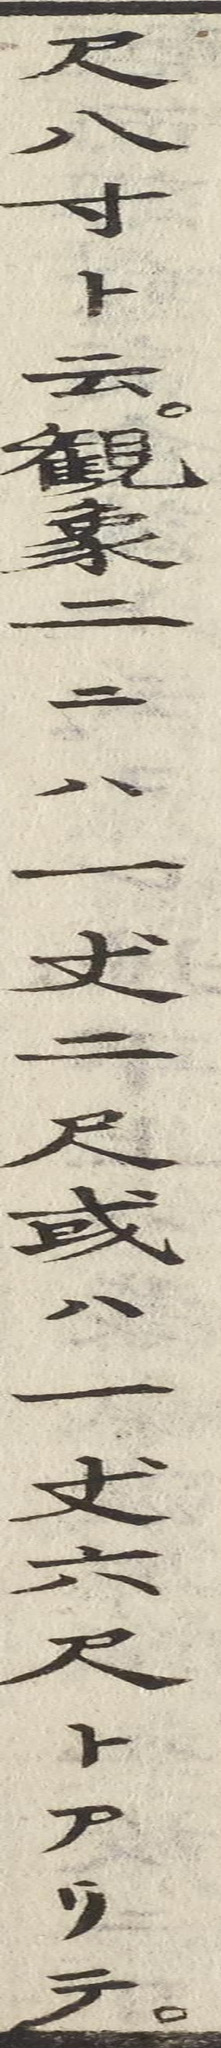尺八寸ト云。観象ニニハ一丈二尺或ハ一丈六尺トアリテ。
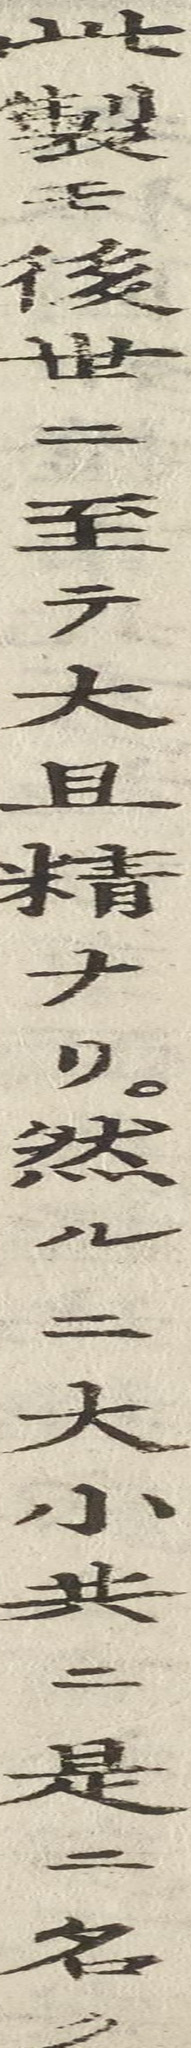此製モ後世ニ至テ大且精ナリ。然ルニ大小共ニ是ニ名ク
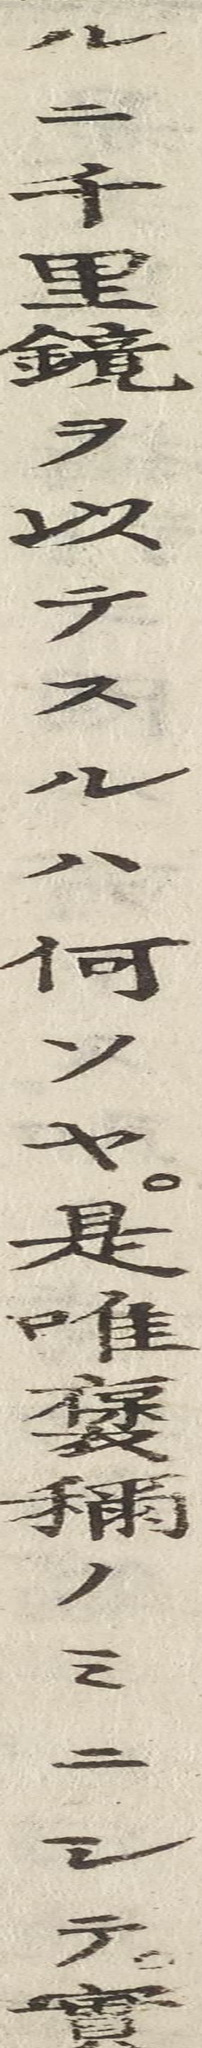ルニ千里鏡ヲ以テスルハ何ソヤ。是唯褒称ノミニシテ。実
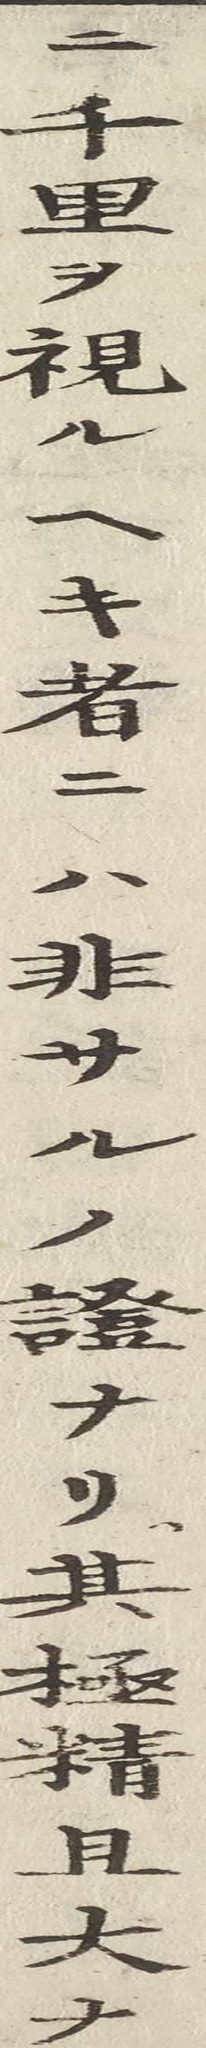ニ千里ヲ視ルヘキ者ニ非サルノ証ナリ。其極精且大ナ
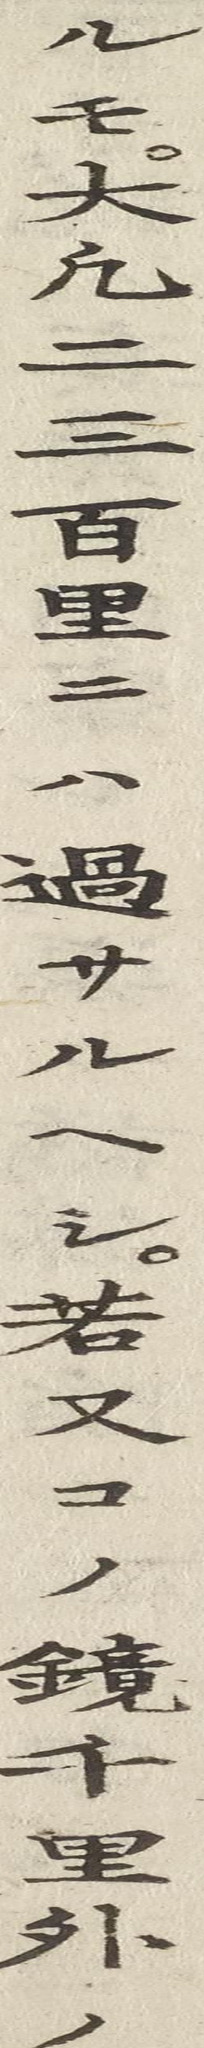ルモ。大凡二三百里ニハ過サルヘシ。若又コノ鏡千里外ノ
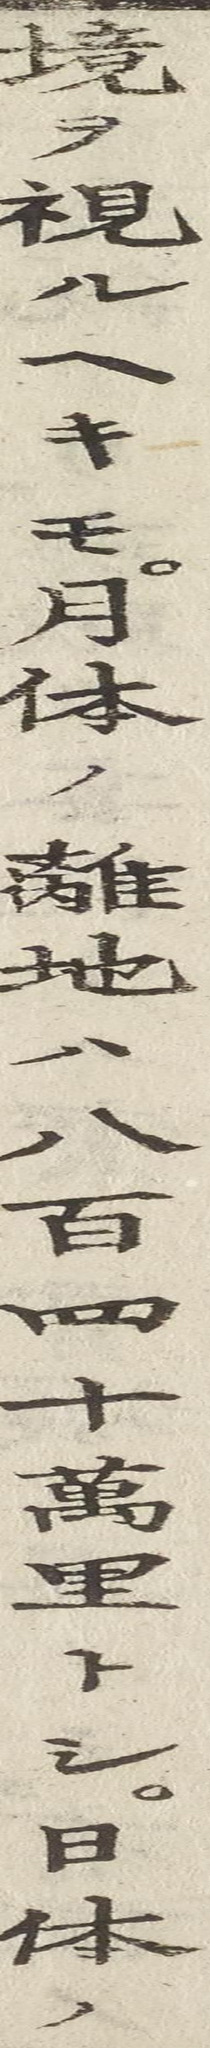境ヲ視ルヘキモ。月体ノ離地ハ八百四十万里トシ。日体ノ
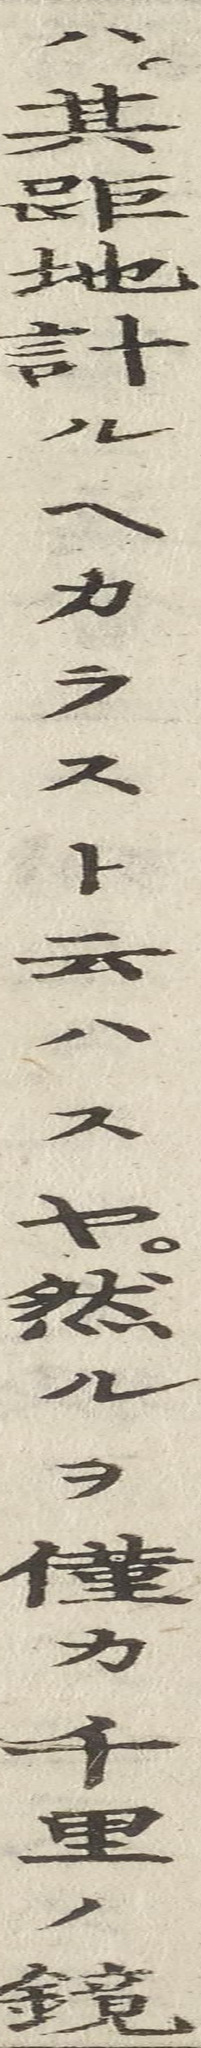ハ。其距地計ルヘカラスト云ハスヤ。然ルヲ僅カ千里ノ鏡
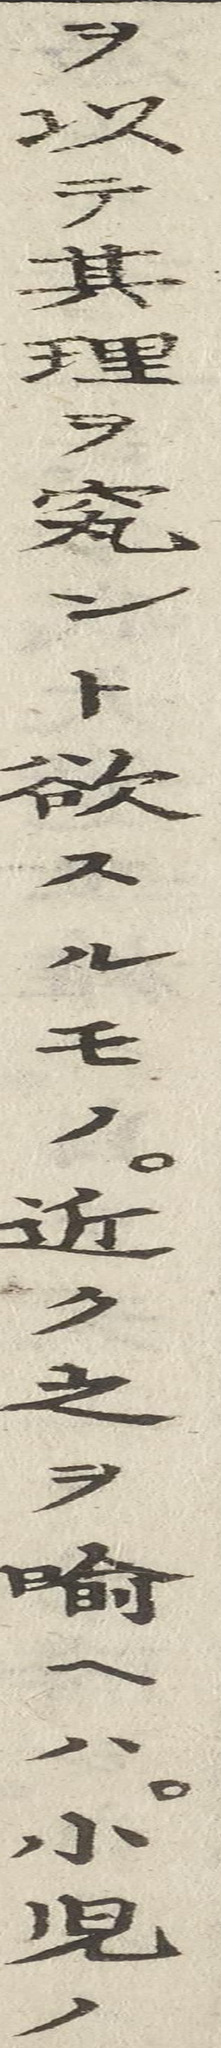ヲ以テ其理ヲ究ント欲スルモノ。近ク之ヲ喩ヘハ。小児ノ
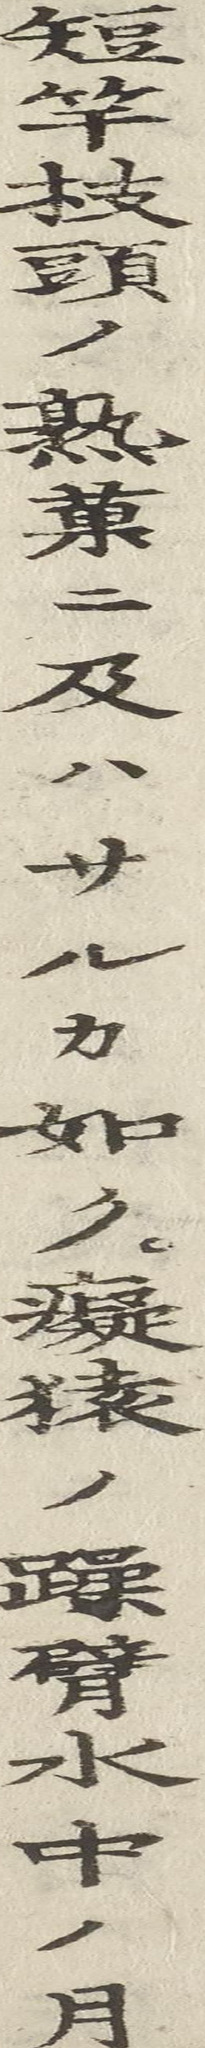短竿枝頭ノ熟菓ニ及ハサルカ如ク。癡猿ノ躁臂水中ノ月
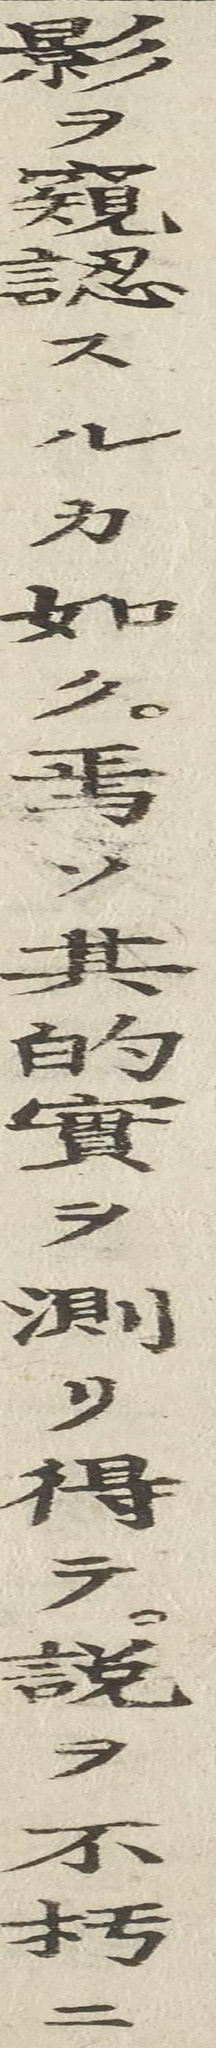影ヲ窺認スルカ如ク。焉ソ其的実ヲ測リ得テ。説ヲ不朽ニ

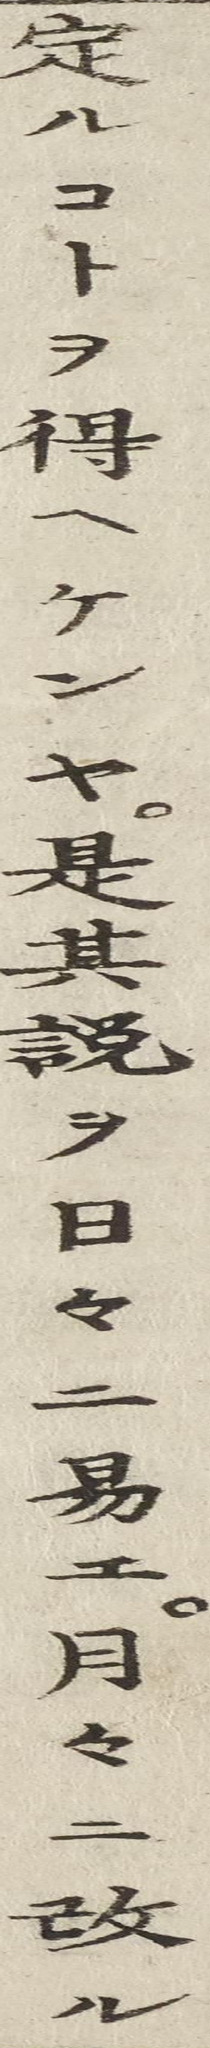定ルコトヲ得ヘケンヤ。是其説ヲ日々ニ易エ。月々ニ改ル
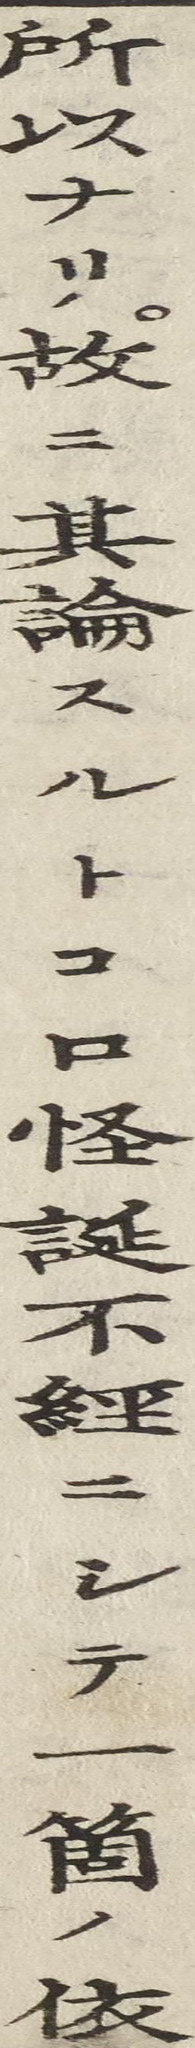所以ナリ。故ニ其論スルトコロ怪誕不経ニシテ一箇ノ依
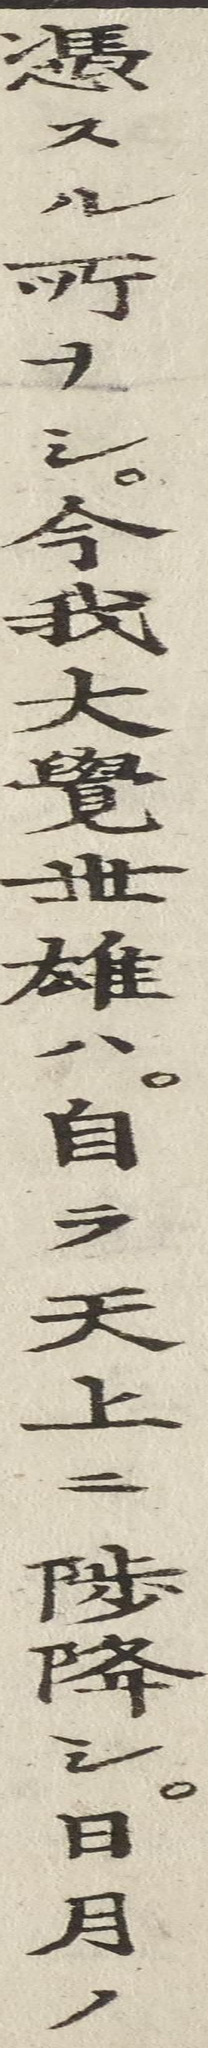憑スル所ナシ。今我大覚世雄ハ。自ラ天上ニ陟降シ。日月ノ
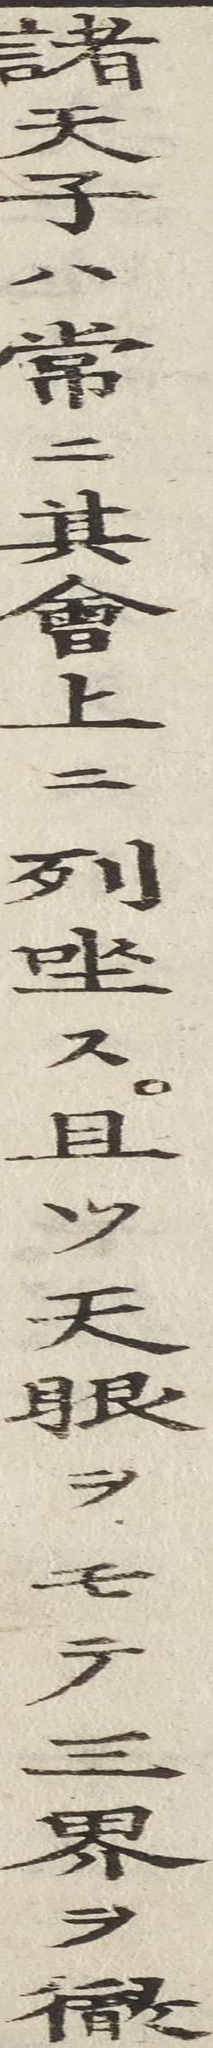諸天子ハ常ニ其会上ニ列坐ス。且ツ天眼ヲモテ三界ヲ徹
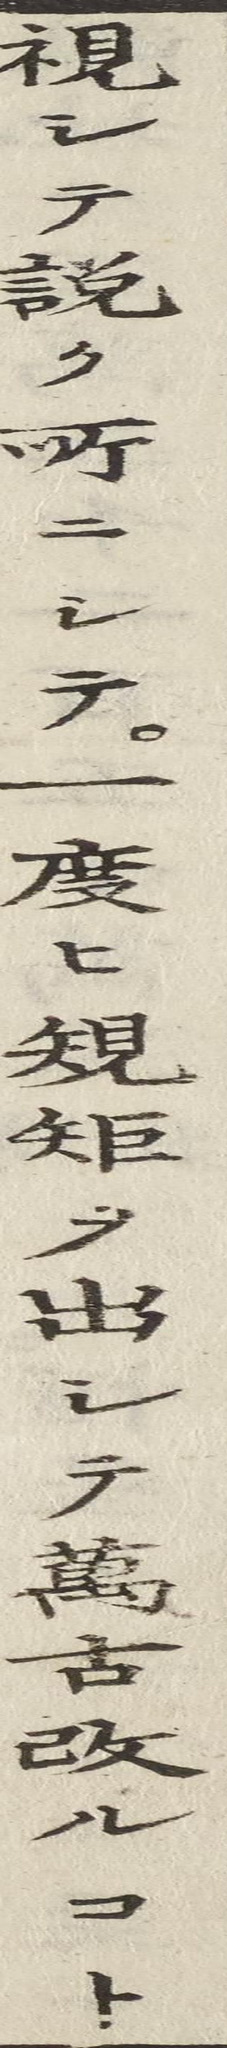視シテ説ク所ニシテ。一度ヒ規矩ヲ出シテ万古改ルコト
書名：護法新論　二編　下
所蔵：東京大学地震研究所図書室 Earthquake Research Institute Library, The University of Tokyo, JAPAN
